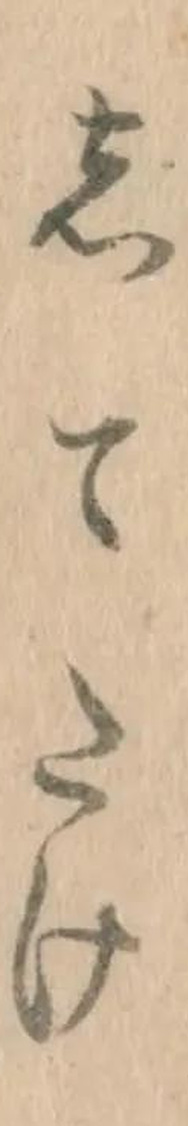してたけ
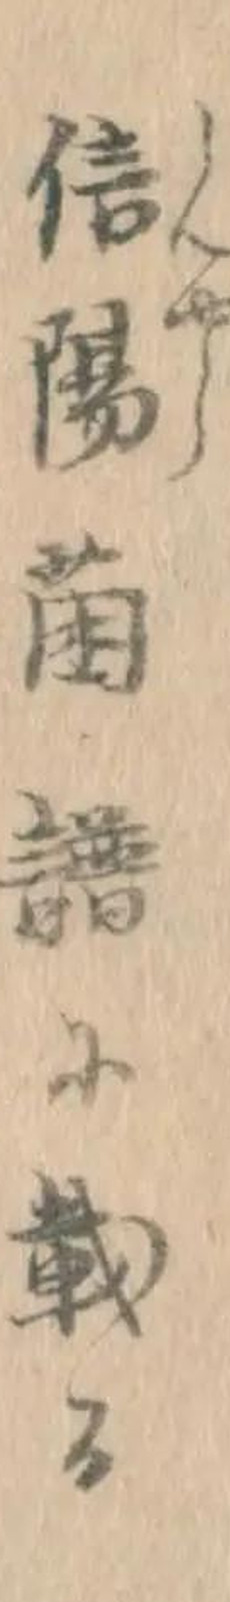信陽菌譜に載る
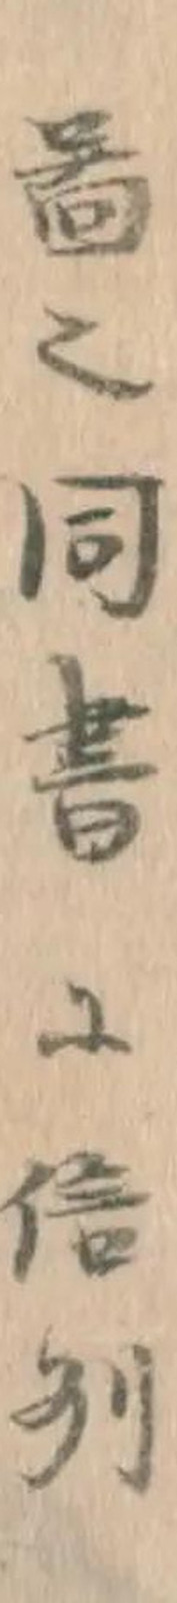図也同書に信州
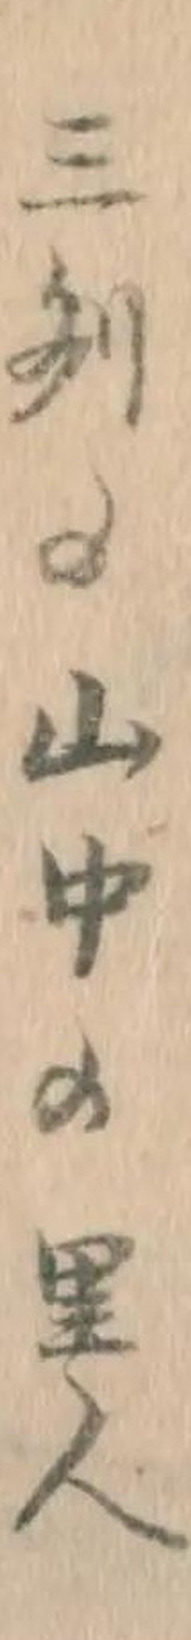三州の山中の里人
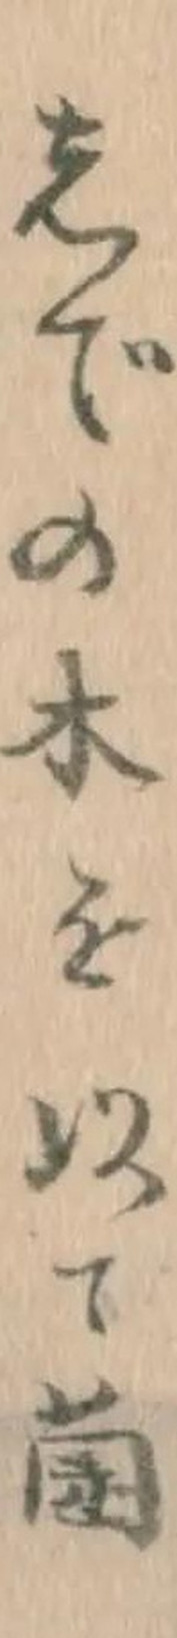しでの木を以て菌
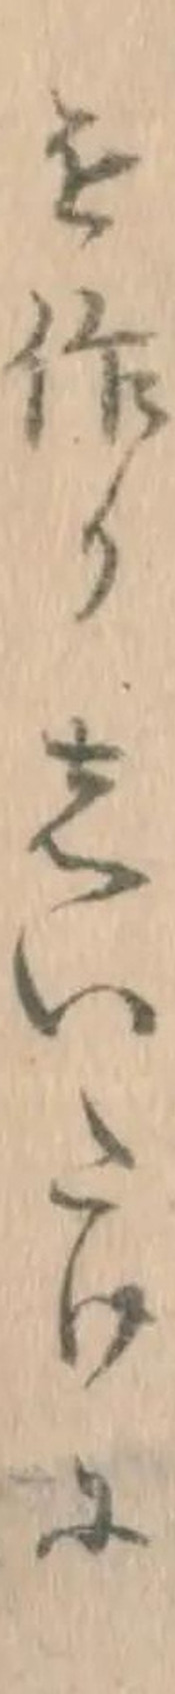を作りしいたけに
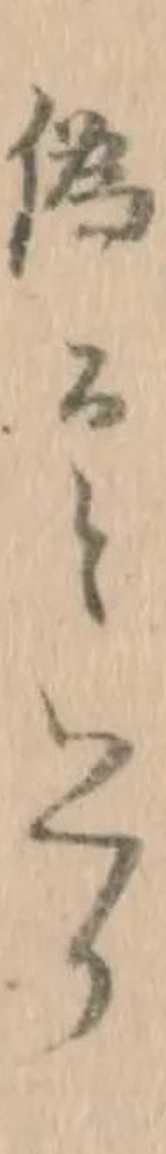偽るといへり
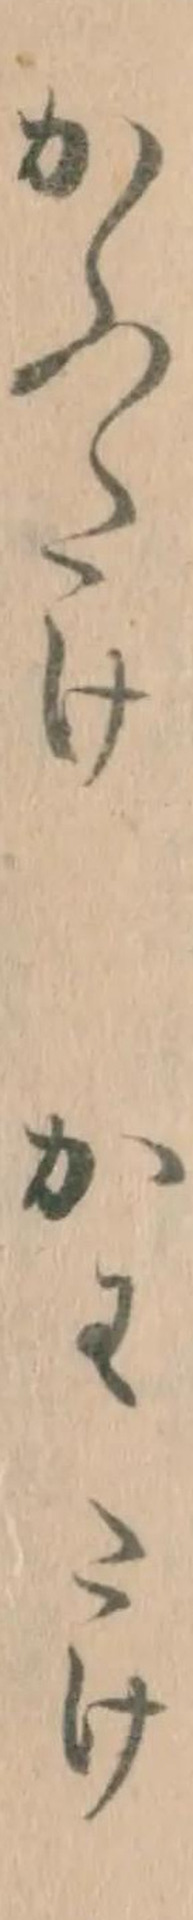かふたけかわたけ
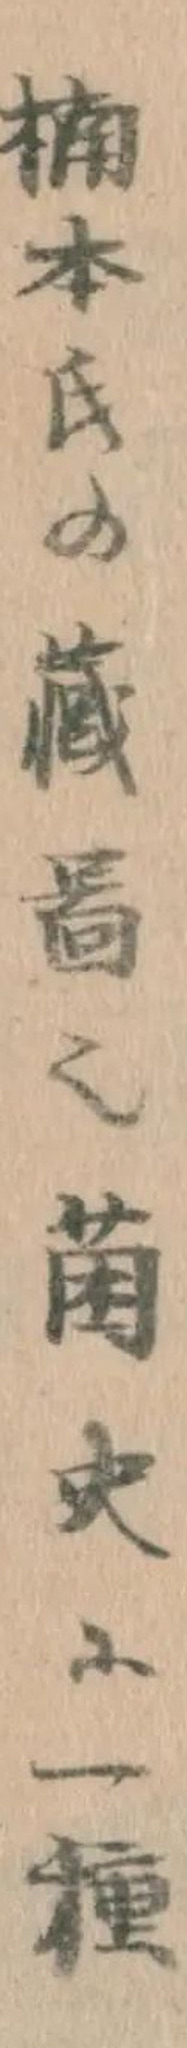楠本氏の蔵図也菌史に一種
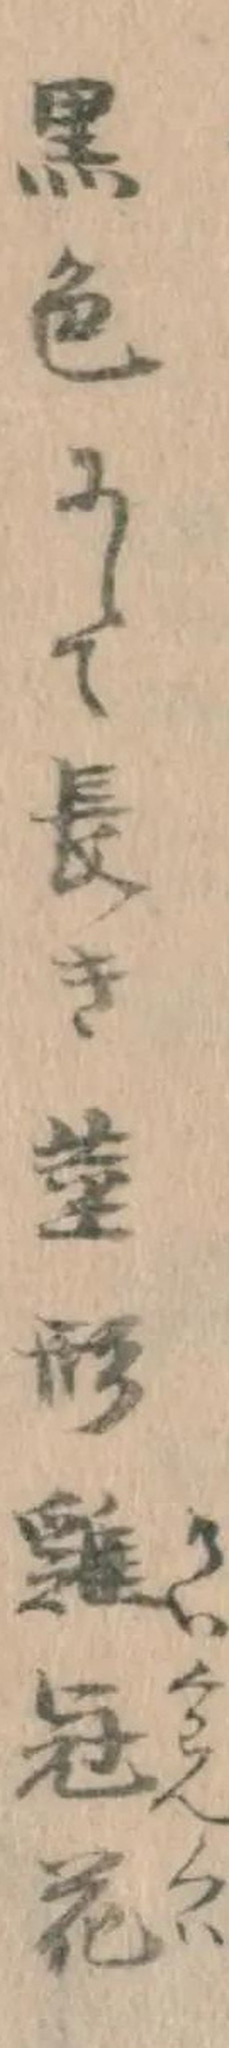黒色にして長き茎形鶏冠花
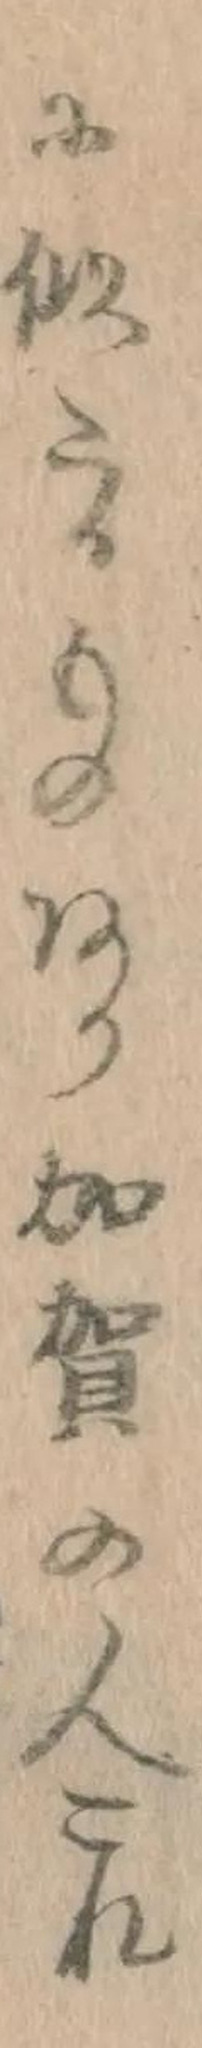に似たるものあり加賀の人これ
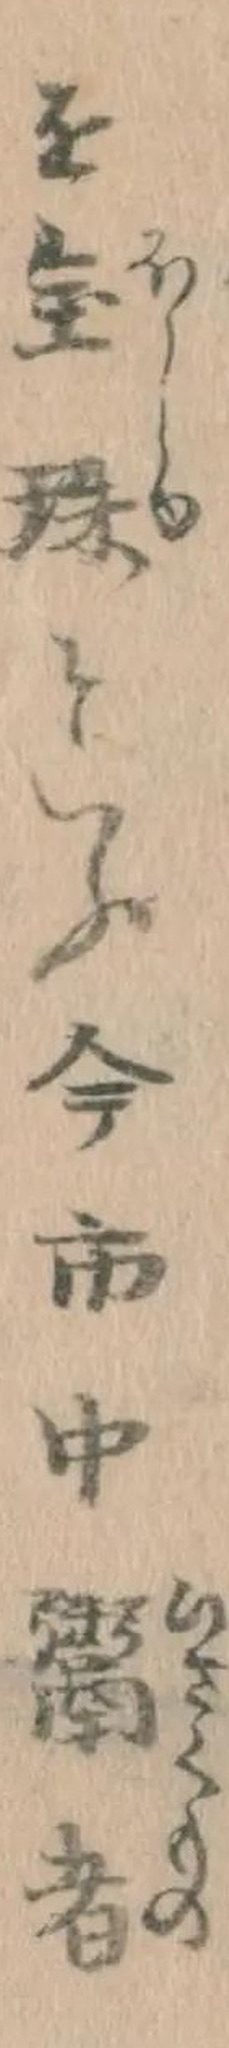を宝珠といふ今市中鬻者
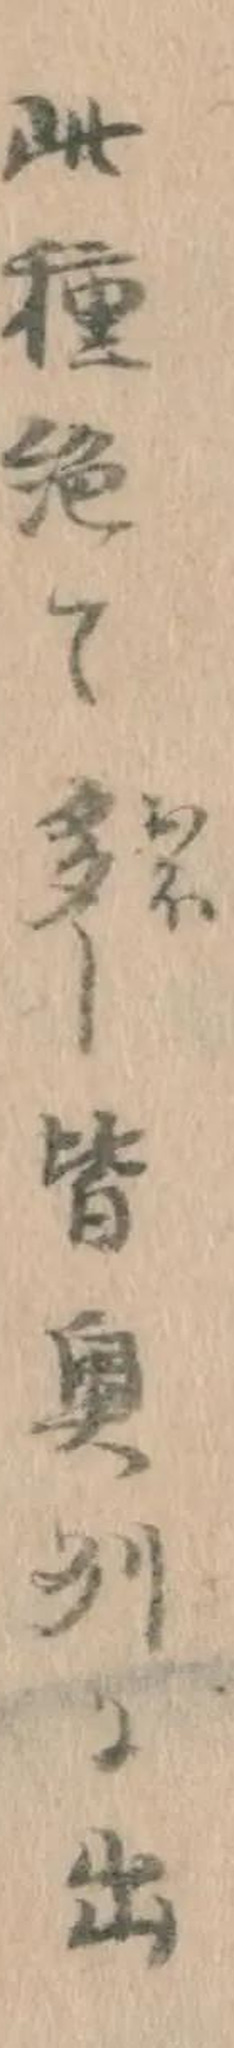此種絶て多し皆奥州に出
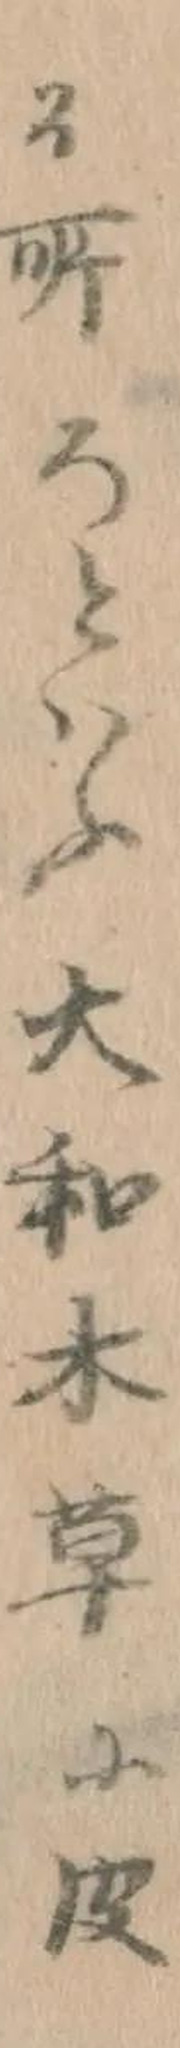る所ろといふ大和本草に皮
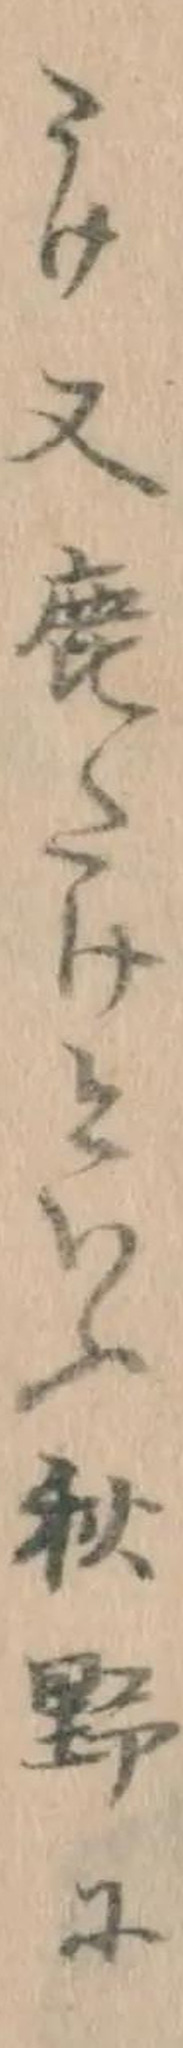たけ又鹿たけといふ秋野に
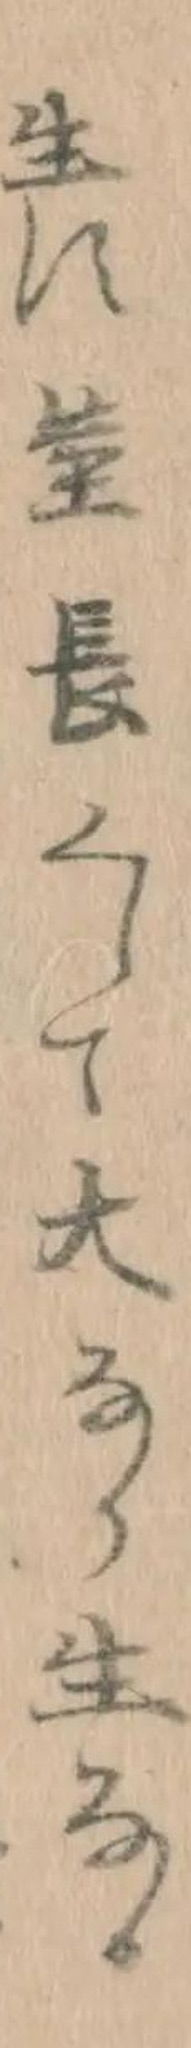生す茎長くして大なり生なる
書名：本草図譜. 巻55-57
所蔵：国立国会図書館 National Diet Library, JAPAN
